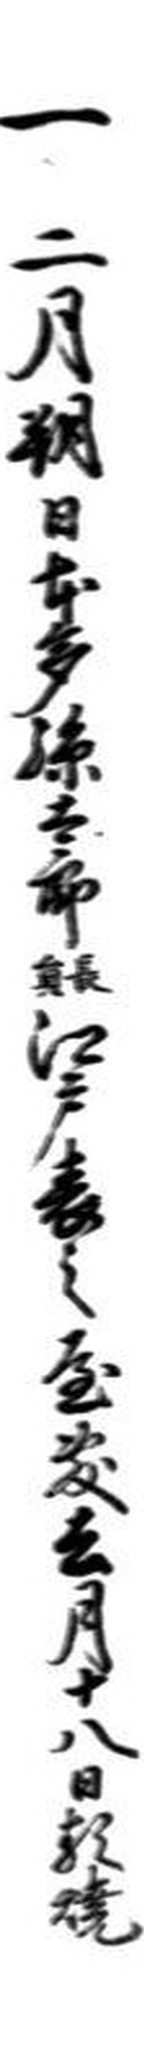一二月朔日本多孫太郎長員江戸表之屋敷去月十八日類焼

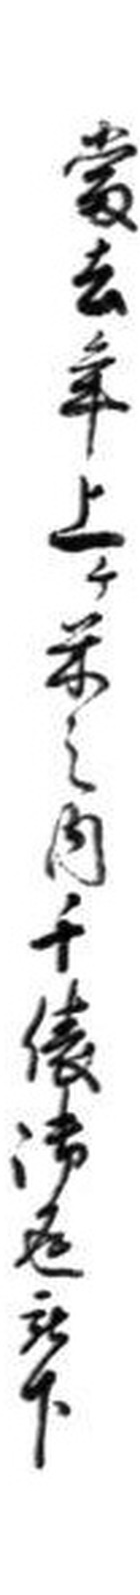当去年上ヶ米之内千俵御返被下
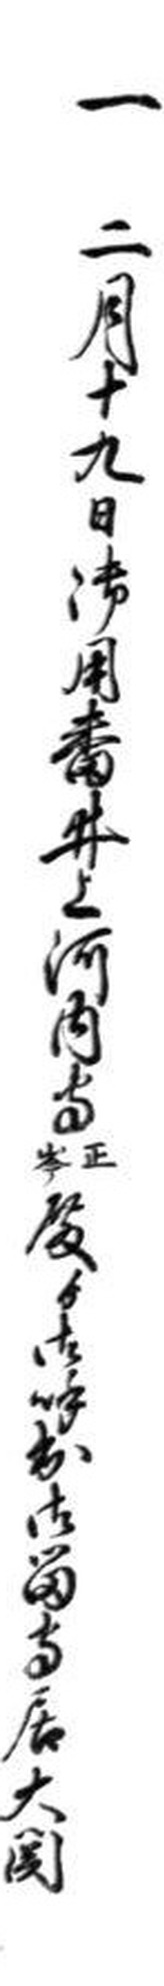一二月十九日御用番井上河内守正岑殿ゟ御呼出御留守居大関
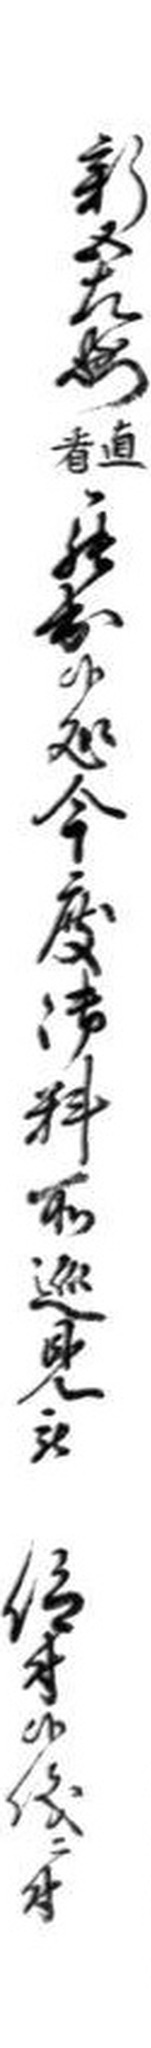新五左衛門直看罷出候処今度御料所巡見被仰付候儀ニ付
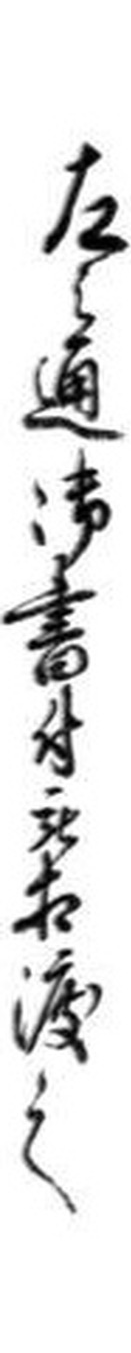左之通御書付被相渡之
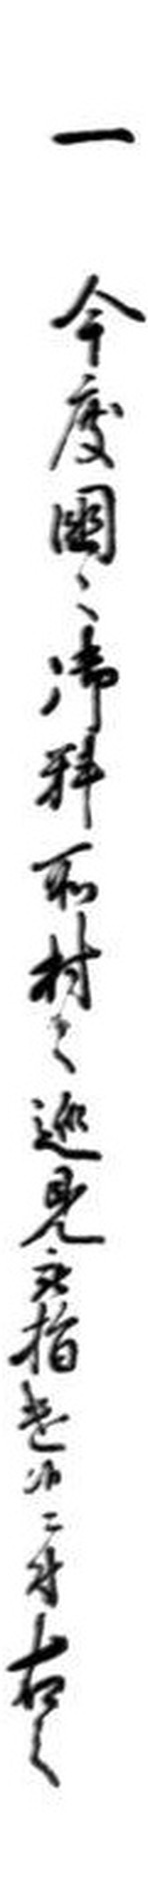一今度国々御料所村々巡見被指遣候ニ付右之
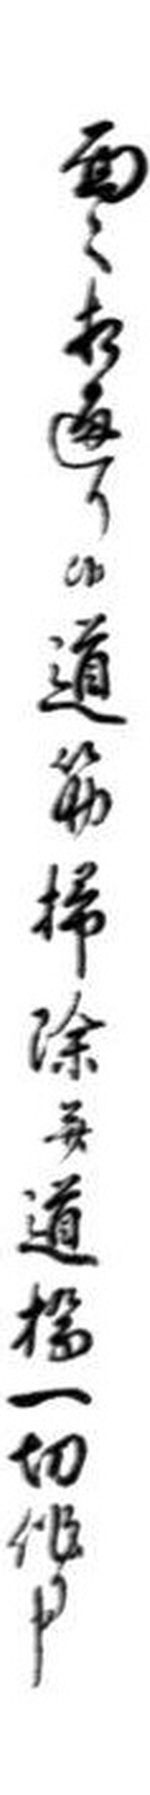面々相通り候道筋掃除并道橋一切作り申
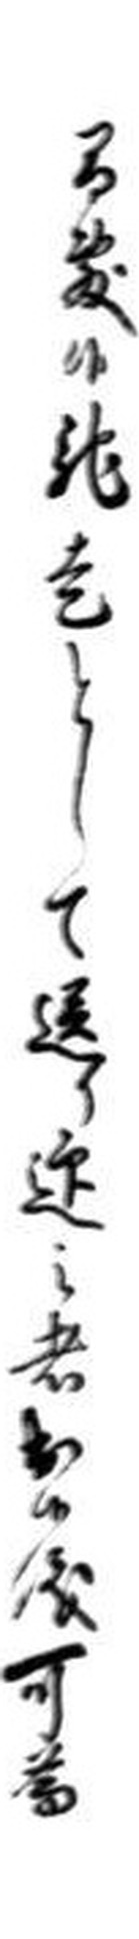間敷候馳走として送り迎之者出候儀可為
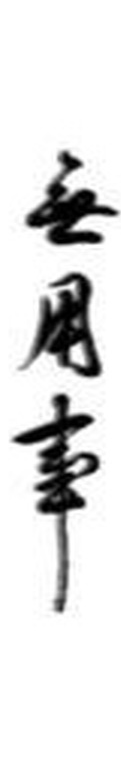無用事
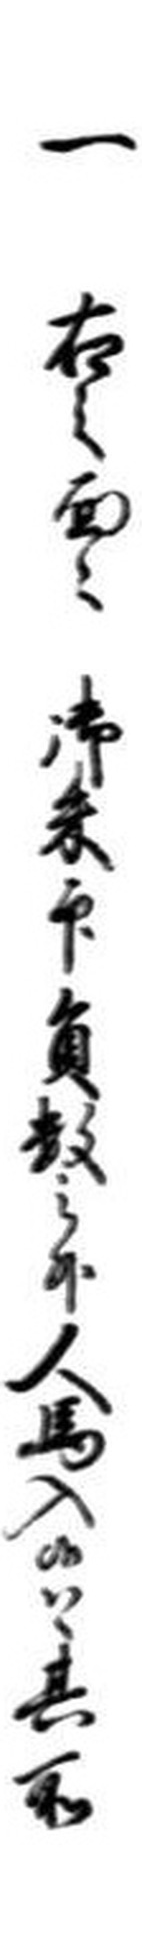一右之面々御朱印員数之外人馬入候ハヽ其所
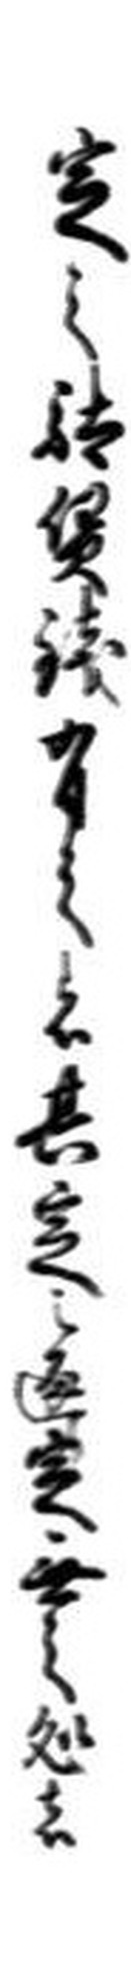定之駄賃銭有之者其定之通定無之処者
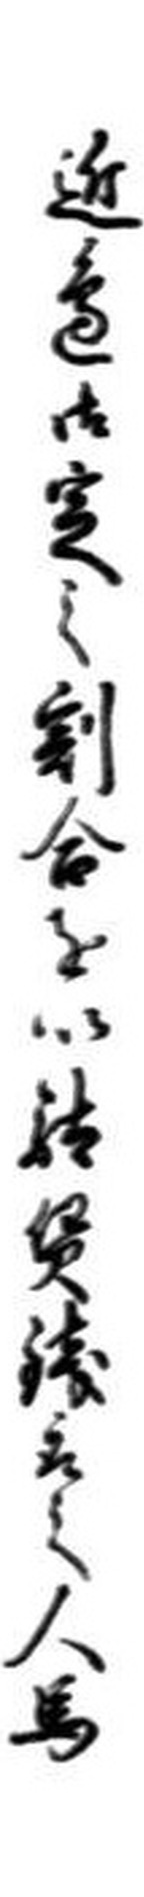近辺御定之割合を以駄賃銭取之人馬
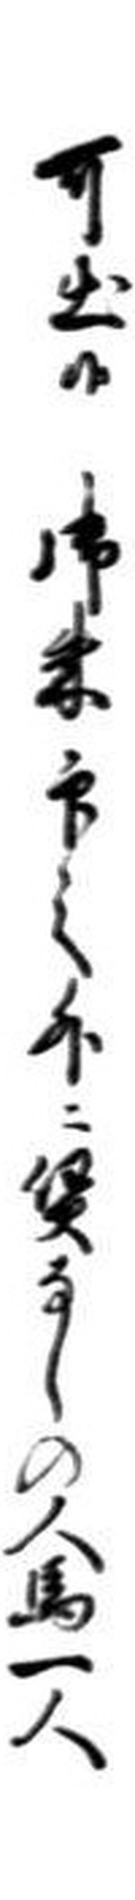可出候御朱印之外ニ賃なしの人馬一人
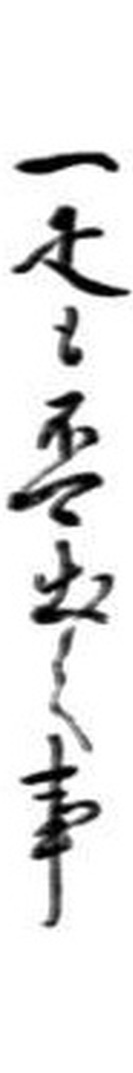一疋も不可出之事
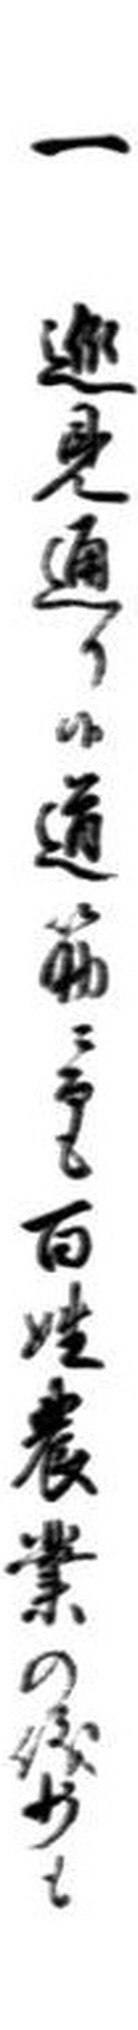一巡見通り候道筋ニ而も百姓農業の儀少も
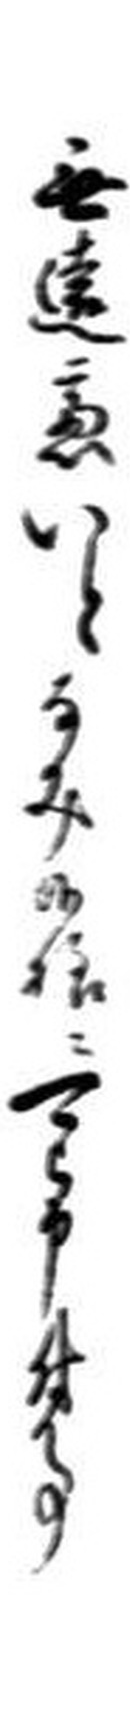無遠慮いとなみ候様ニ可被申付事
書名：家譜 三十一 吉邦公 享保元年
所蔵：福井県文書館 Fukui Prefectural Archives
